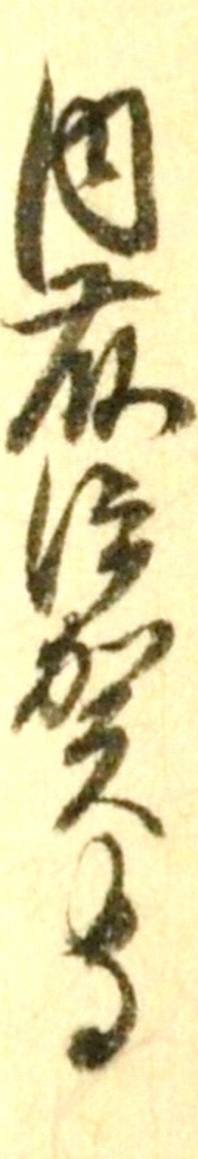内藤伊賀守

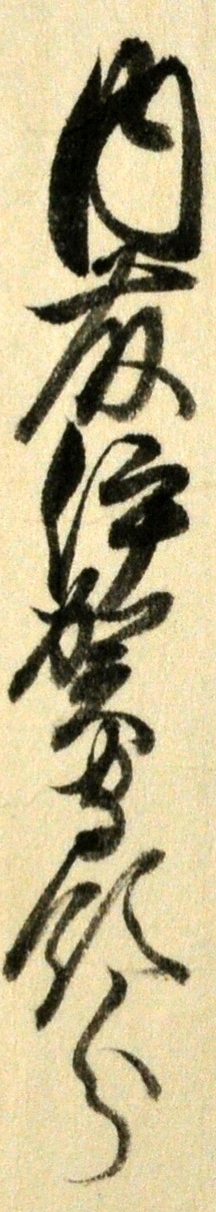内藤伊賀守領分
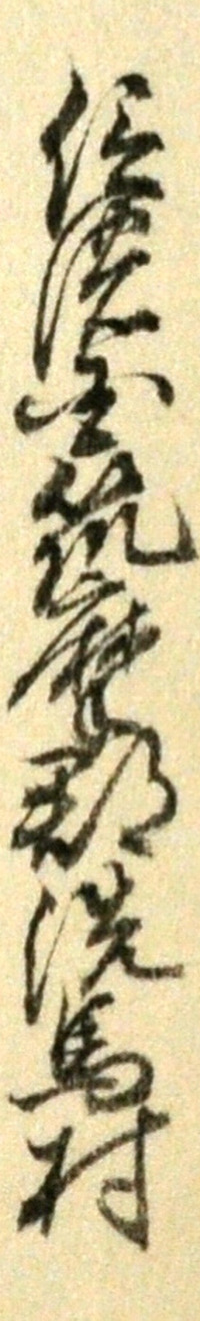信濃国筑摩郡洗馬村

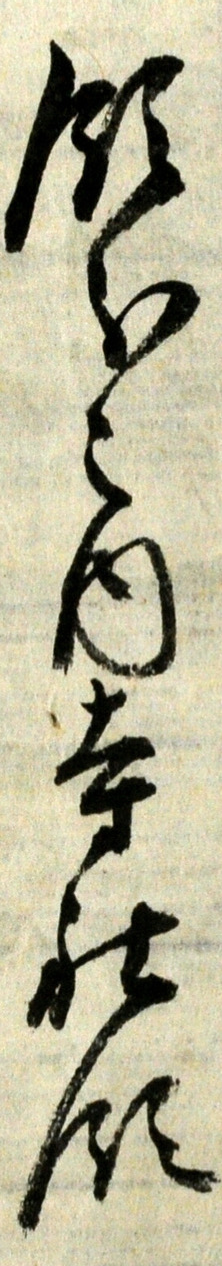領分之内寺社領
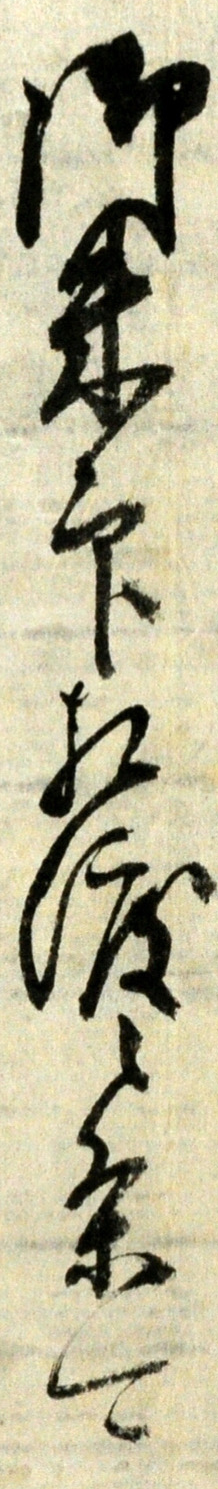御朱印相渡候条可
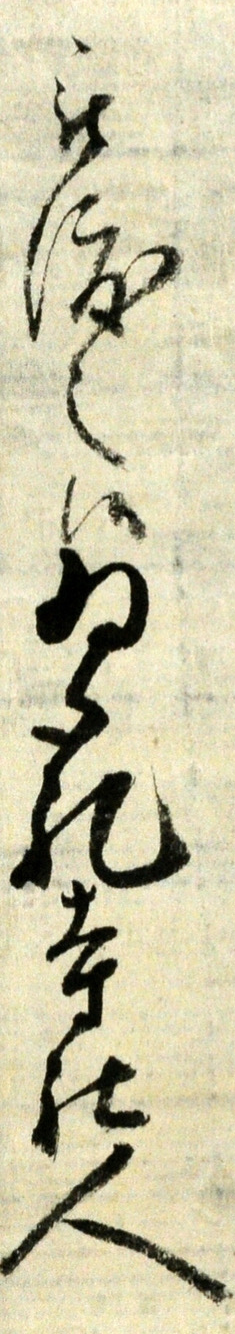被渡之候為御礼寺社人
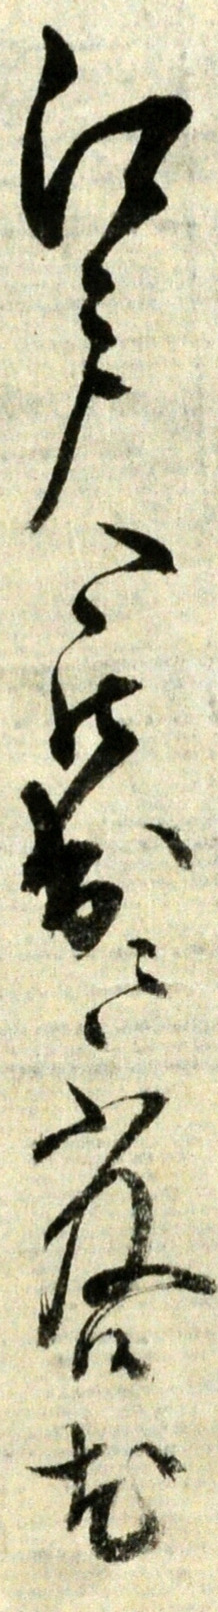江戸へ罷出ニ不及候尤
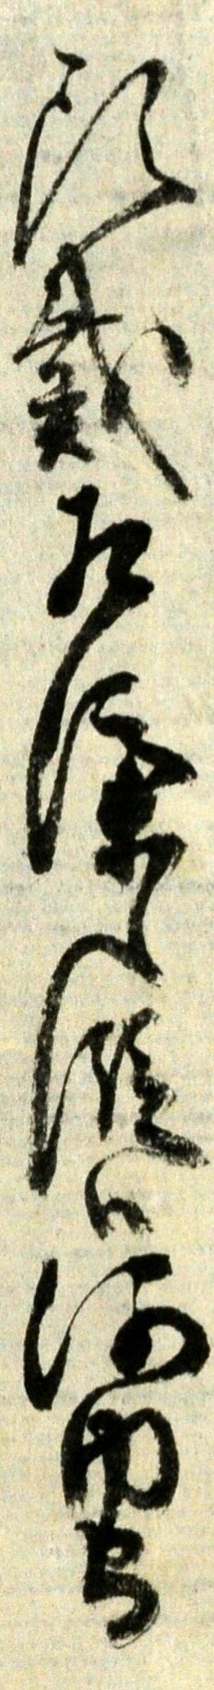頂戴相済候段ハ河内守
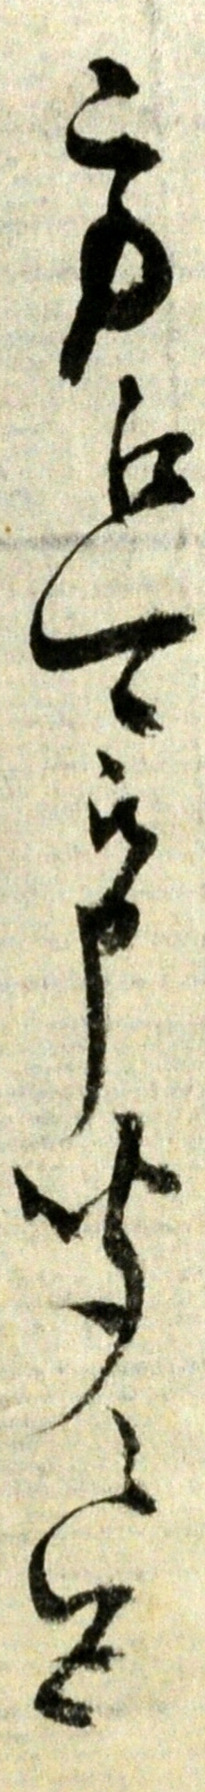方江可被申聞候以上
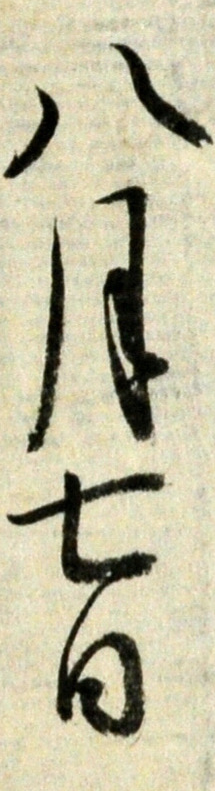八月七日

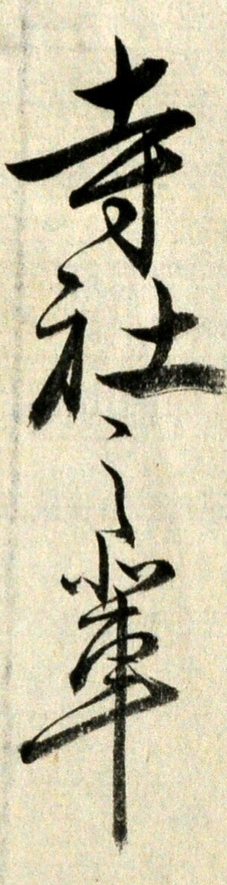寺社之輩
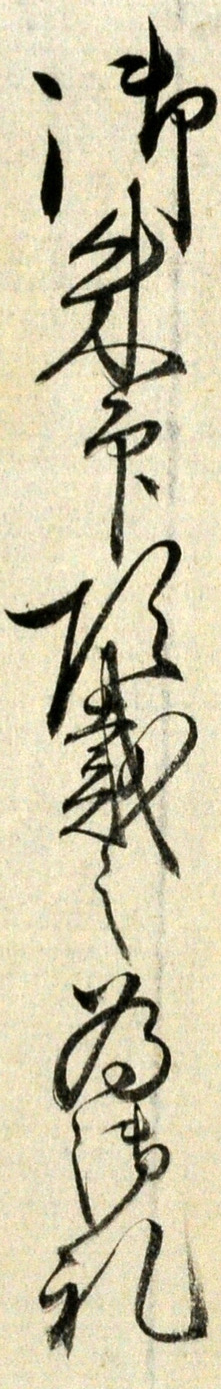御朱印頂戴之為御礼
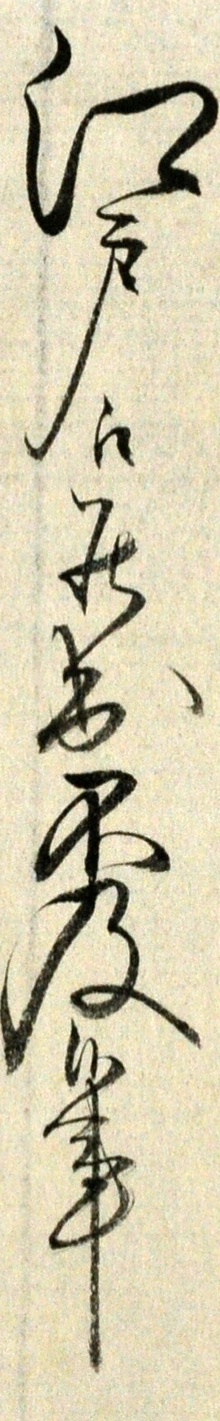江戸江罷出不及候事

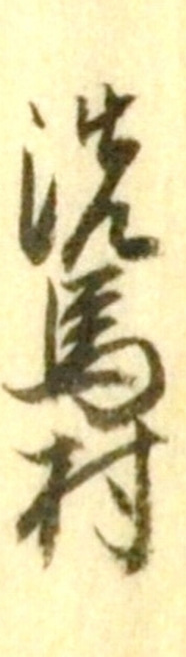洗馬村
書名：長興寺朱印関係文書〔一括〕
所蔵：伊那市立高遠町図書館・合同会社AMANE
